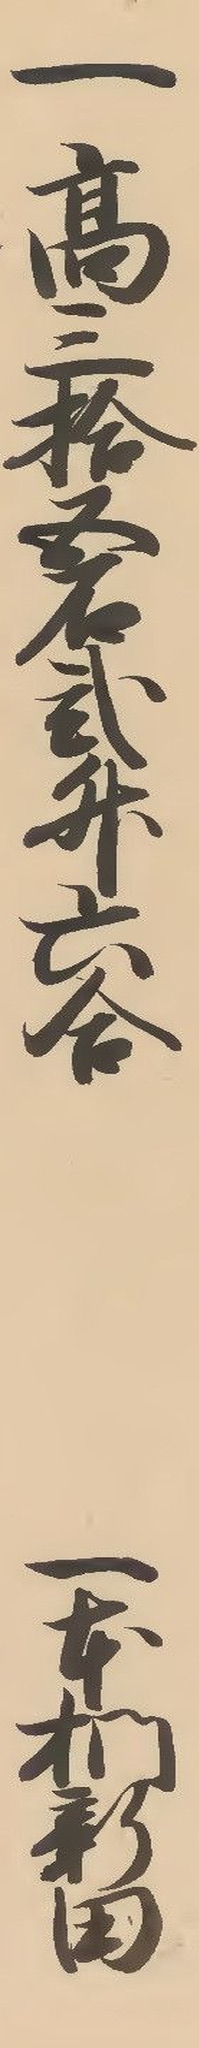一高三拾五石弐升六合一本椚新田
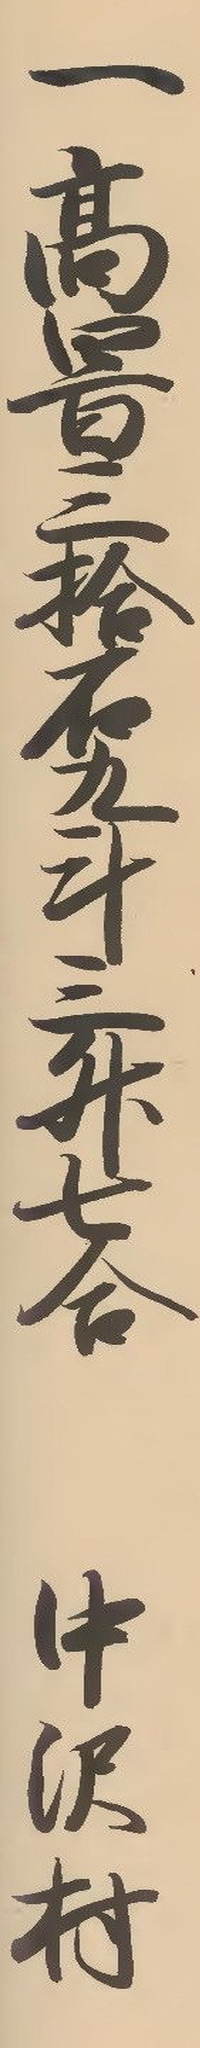一高四百三拾石九斗三升七合中沢村
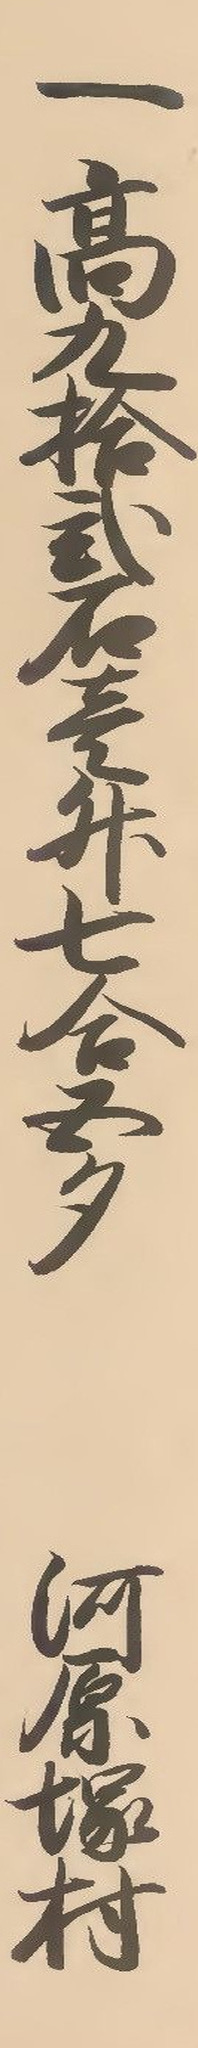一高九拾弐石壱升七合五勺河原塚村
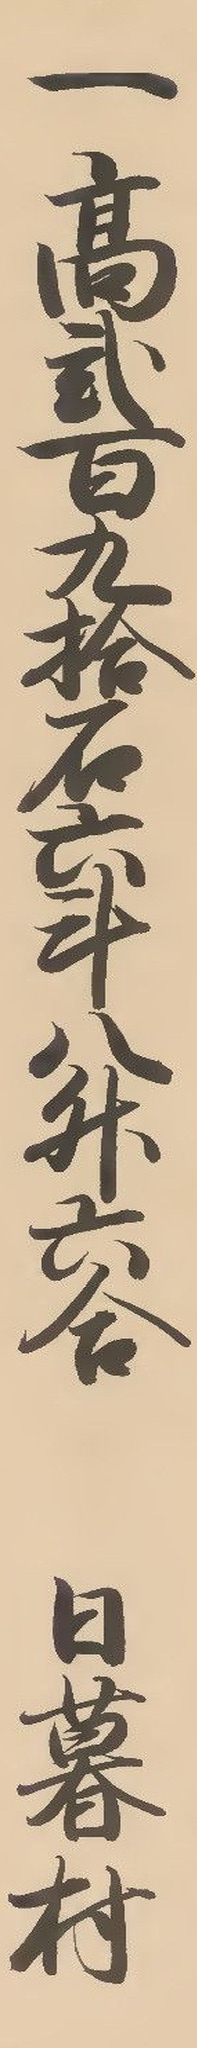一高弐百九拾石六斗八升六合日暮村
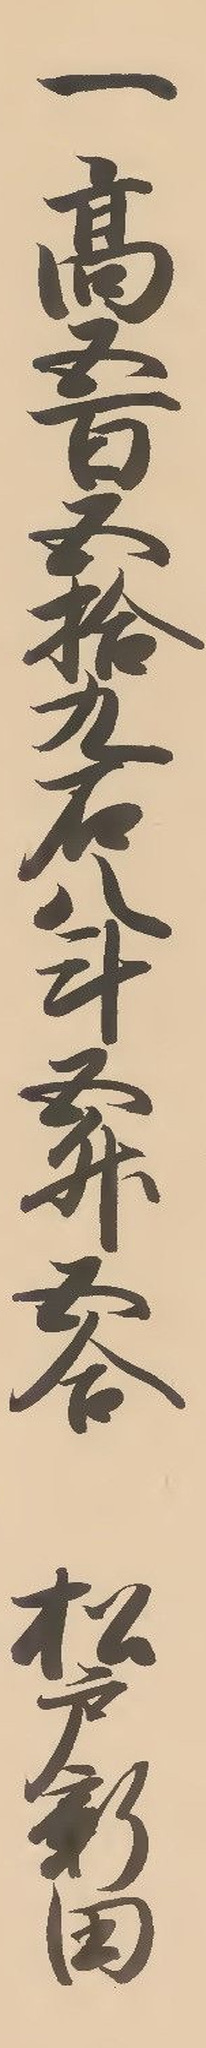一高五百五拾九石八斗五升五合松戸新田
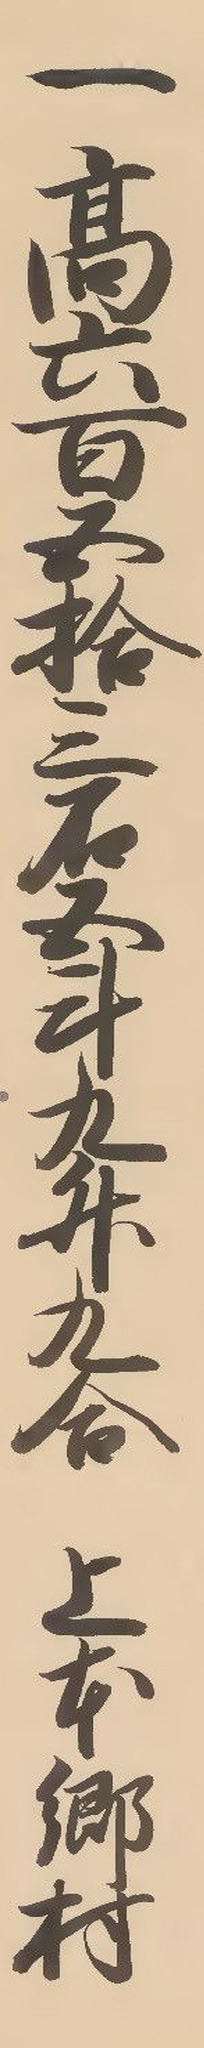一高六百五拾三石五斗九升九合上本郷村

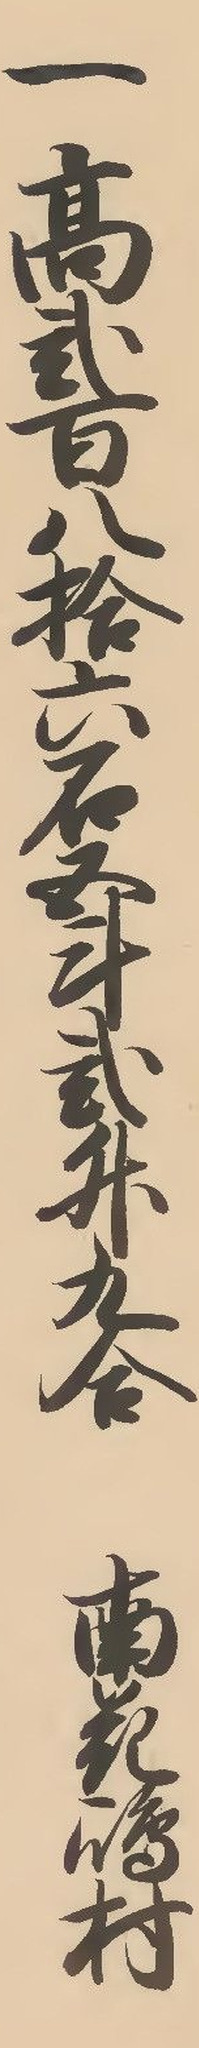一高弐百八拾六石五斗弐升九合南花島村
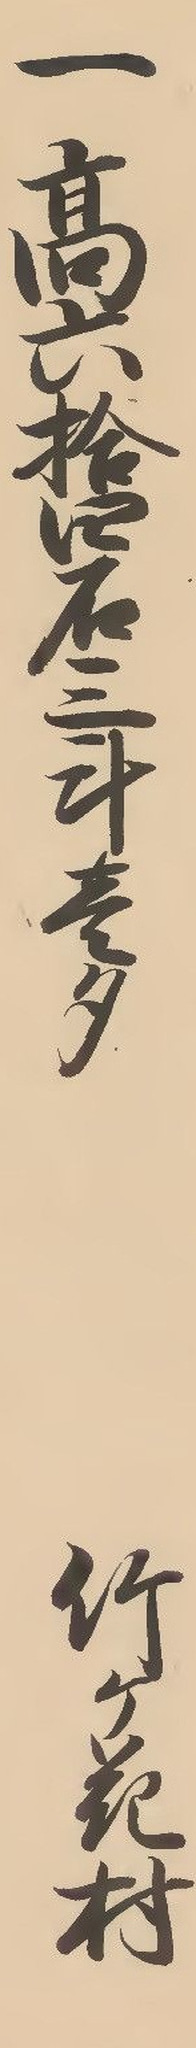一高六拾四石三斗壱勺竹ヶ花村
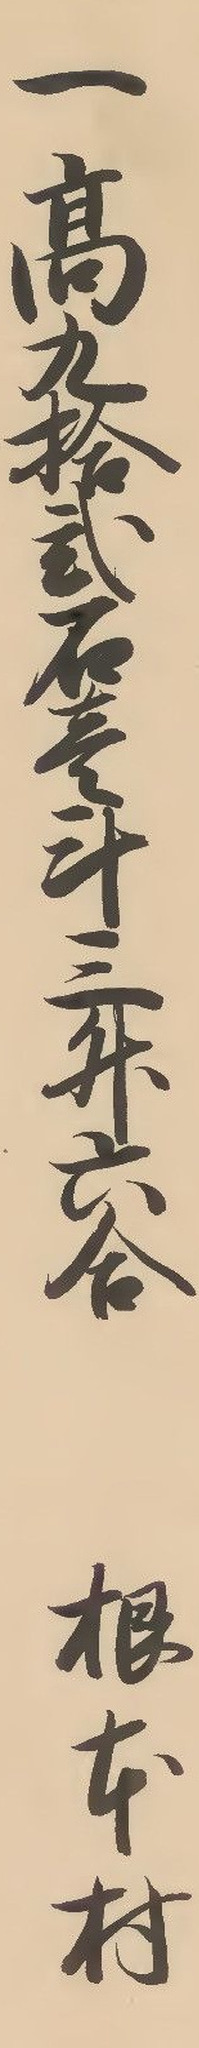一高九拾弐石壱斗三升六合根本村
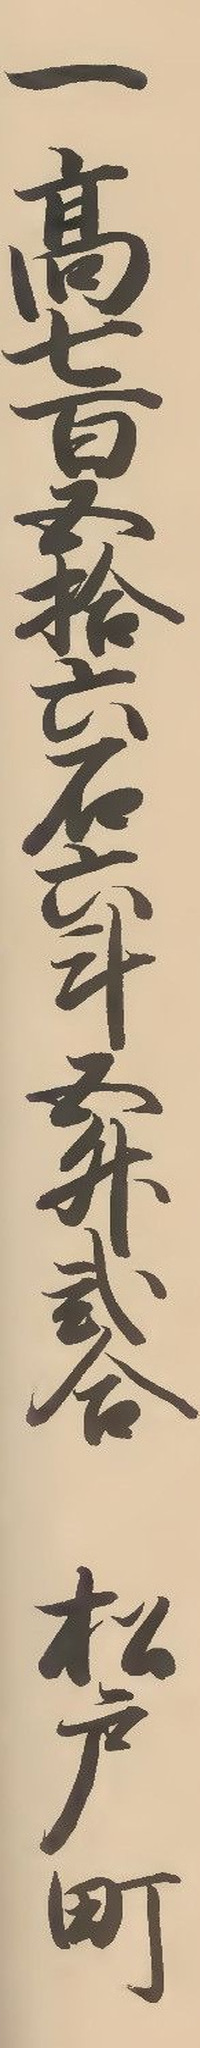一高七百五拾六石六斗五升弐合松戸町
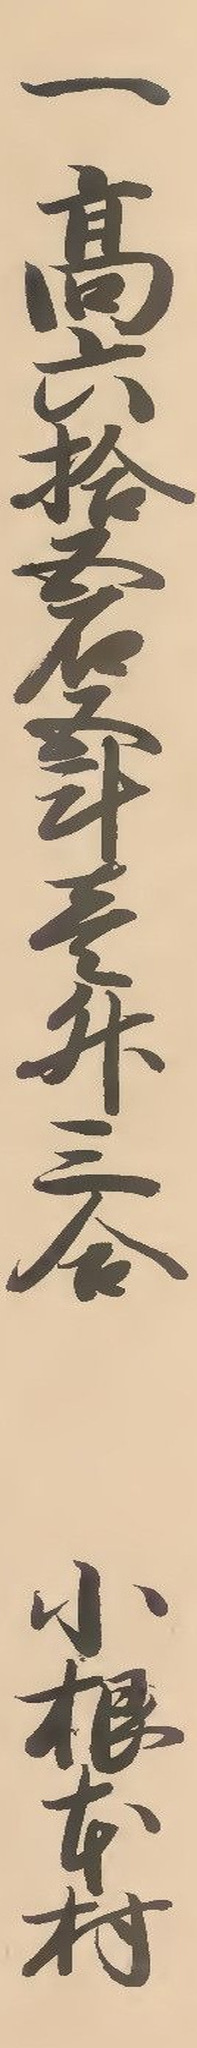一高六拾五石五斗壱升三合小根本村
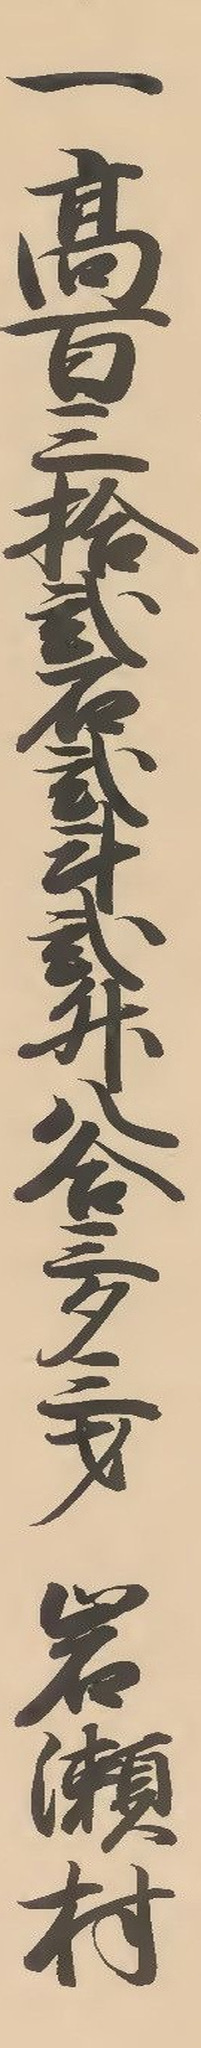一高百三拾弐石弐斗弐升八合三勺三才岩瀬村
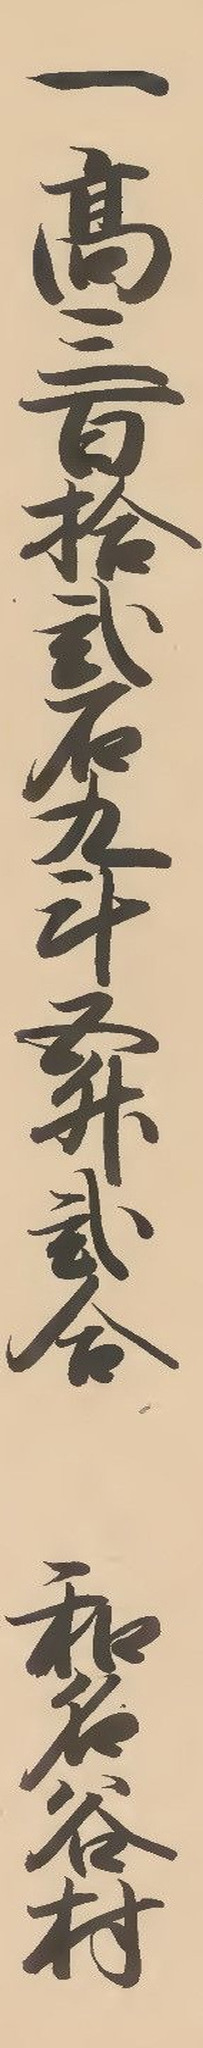一高三百拾弐石九斗五升弐合和名谷村
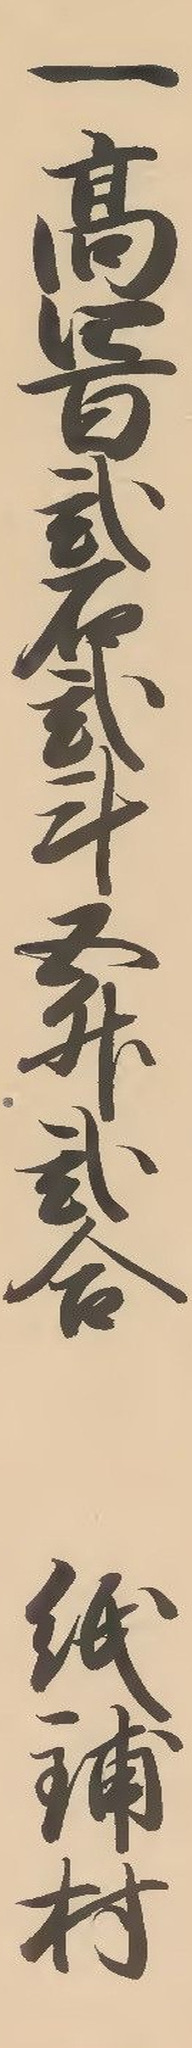一高四百弐石弐斗五升弐合紙鋪村

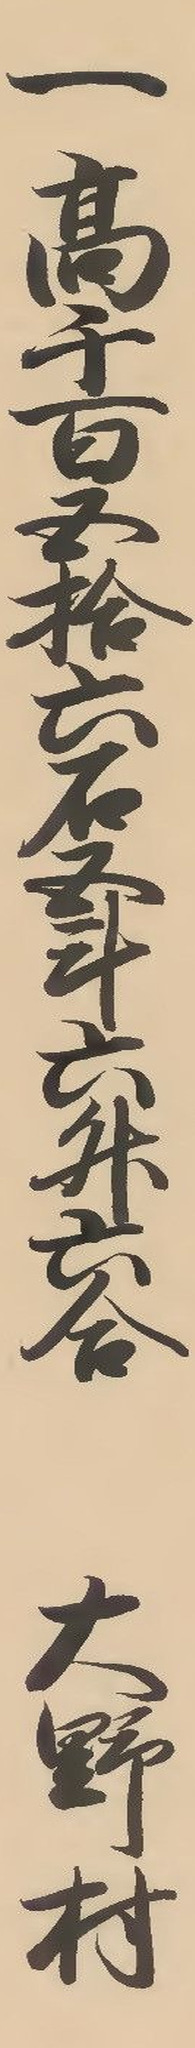一高千百五拾六石五斗六升六合大野村
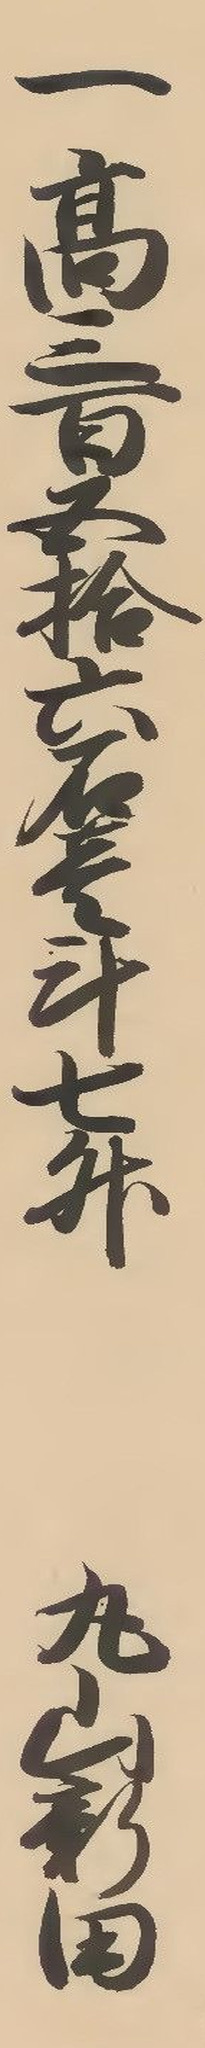一高三百五拾六石壱斗七升丸山新田
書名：下総国郷帳
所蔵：国立公文書館 National Archives of Japan
